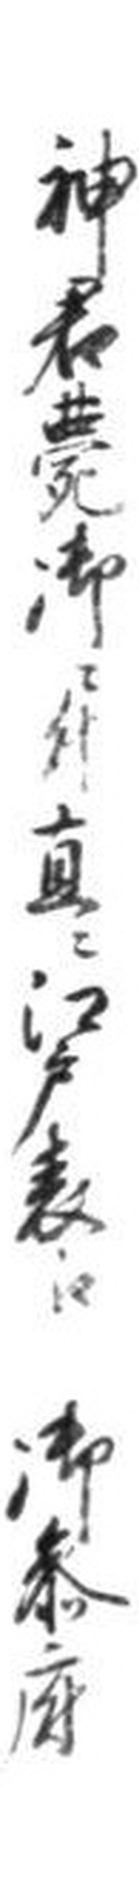神君薨御ニ付直ニ江戸表江御参府
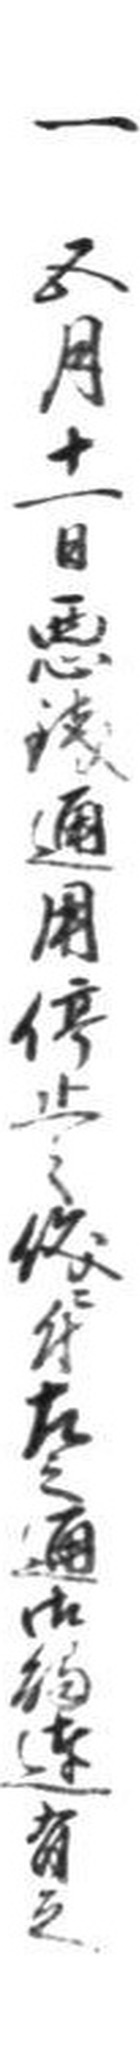一五月十一日悪銭通用停止之儀ニ付左之通御触達有之
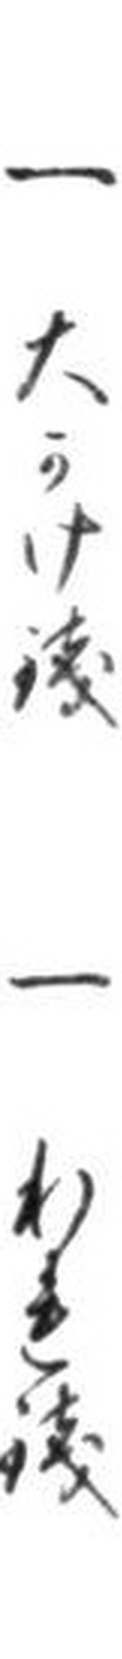一大かけ銭一われ銭
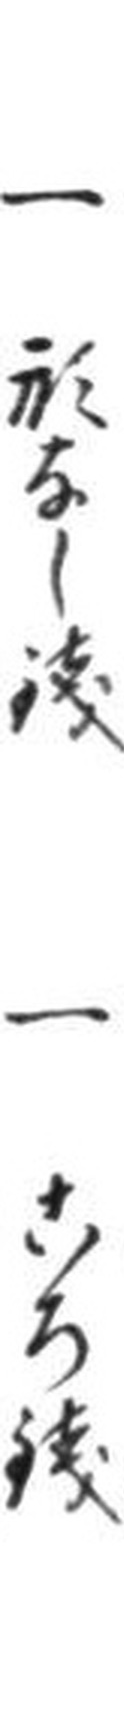一形なし銭一ころ銭
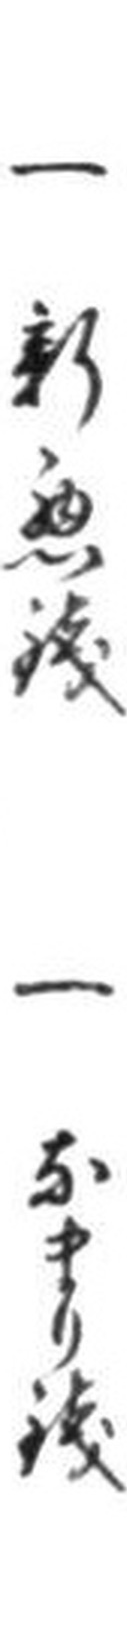一新悪銭一なまり銭
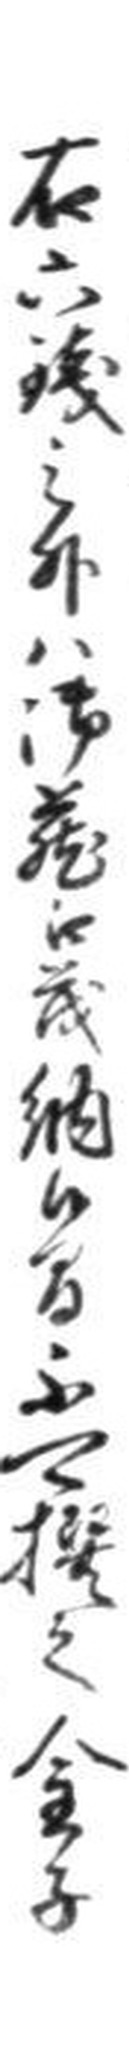右六銭之外ハ御蔵江茂納候間不可撰之金子
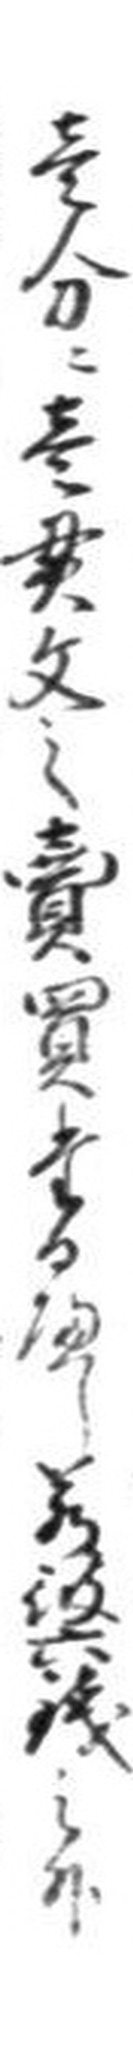壱分ニ壱貫文之売買たるへし若彼六銭之外
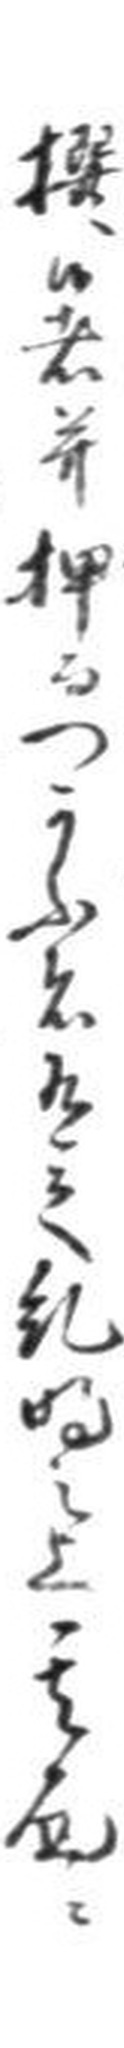撰候者并押而つかふ者有之糺明之上其面ニ
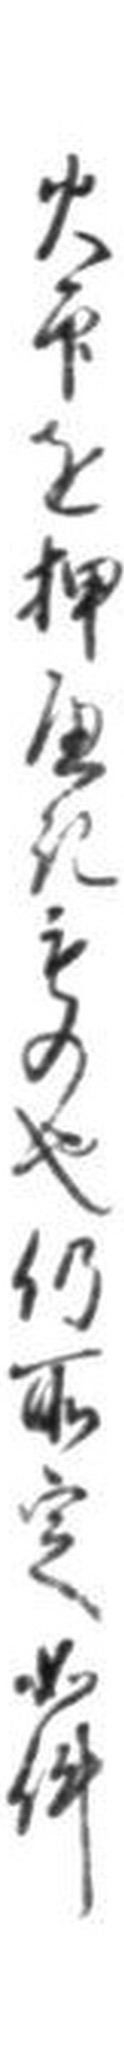火印を押へきもの也仍所定如件
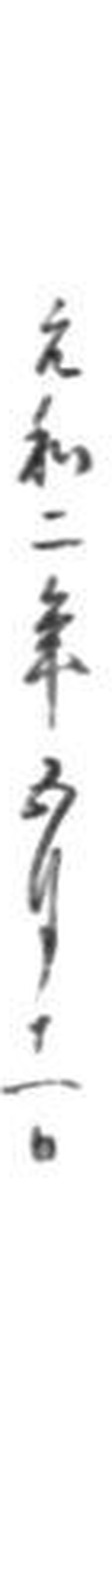元和二年五月十一日
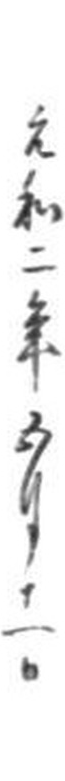元和二年五月十一日
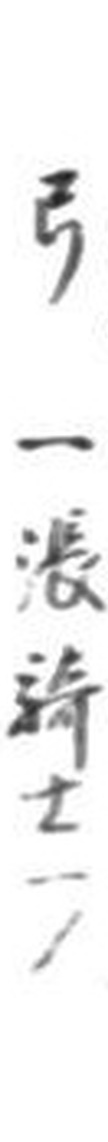弓一張騎士一人
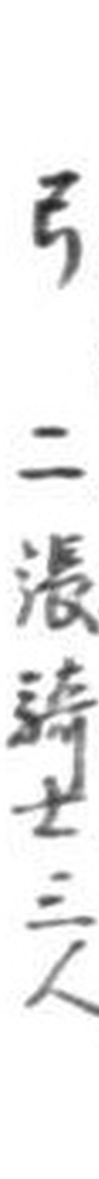弓二張騎士三人
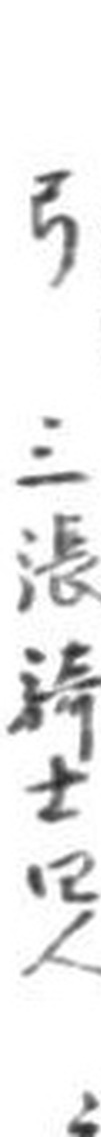弓一張騎士一人
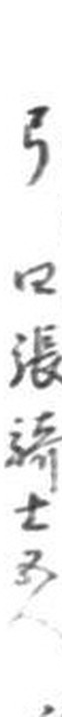弓一張騎士一人
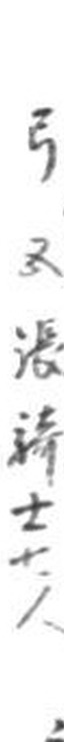弓一張騎士一人
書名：家譜 二 忠直公 従文禄四年到慶安四年
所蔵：福井県文書館 Fukui Prefectural Archives
